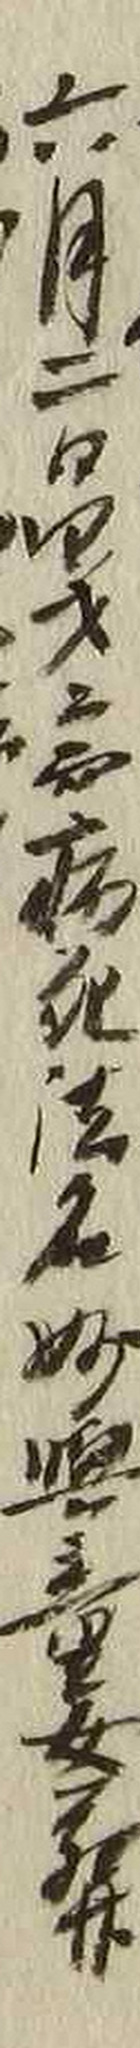六月二日四才に而病死法名妙誉童女葬
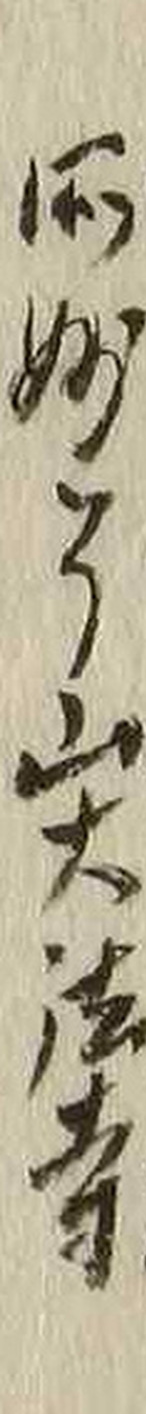所妙了山大法寺
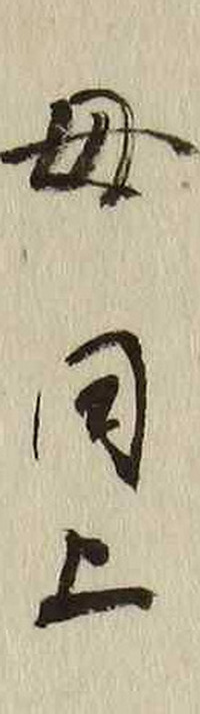母同上
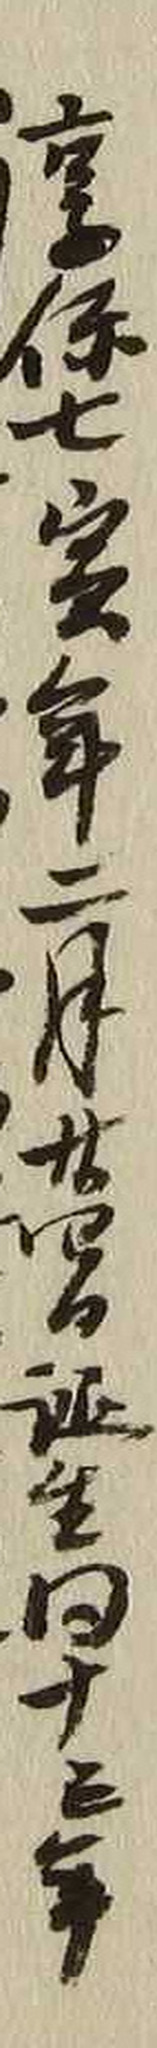善治享保七寅年二月廿四日誕生同十巳年
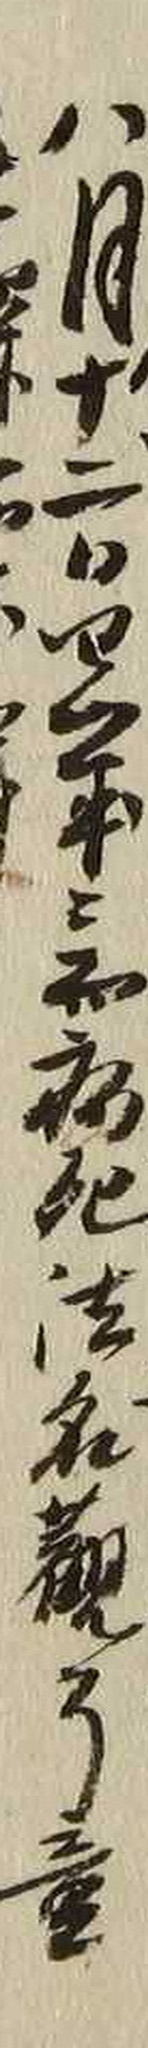八月十二日四歳に而病死法名観了童
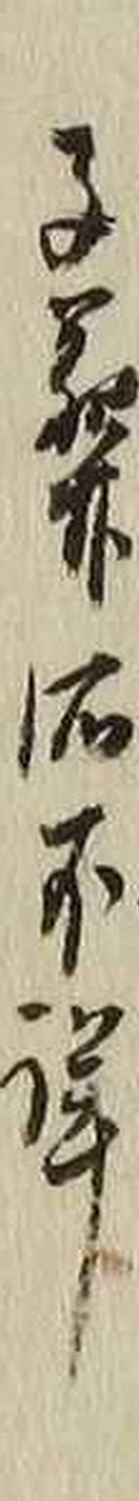子葬所不詳
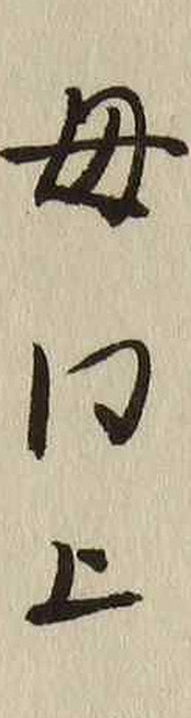母同上
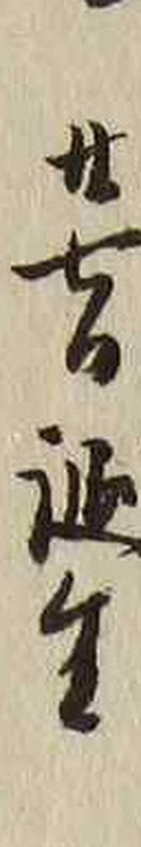廿七日誕生
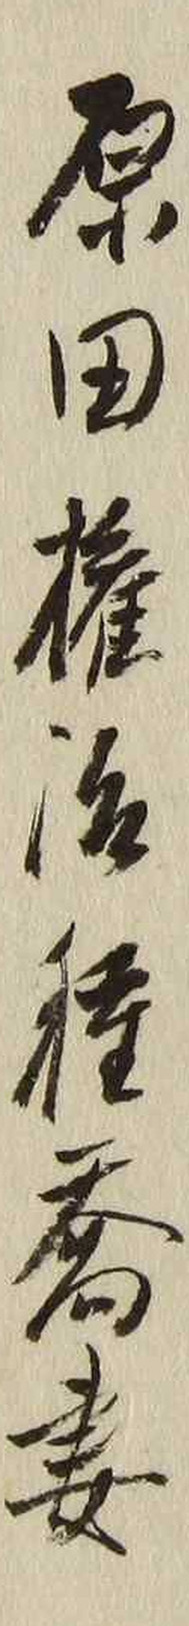原田権治種喬妻
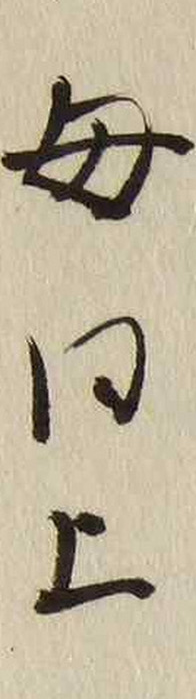母同上

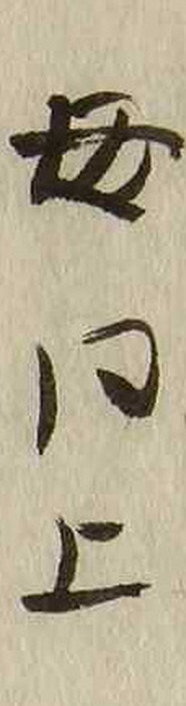母同上
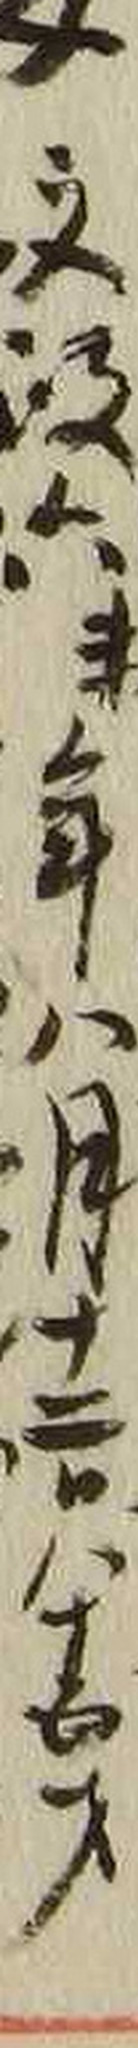文政六未年八月十二日八十五才
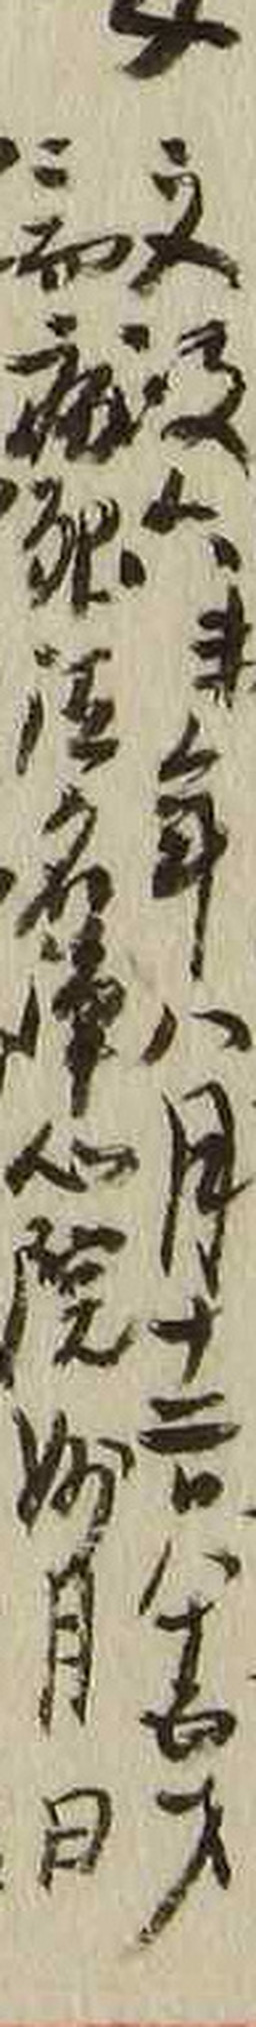に而病死法名浄心院妙月日
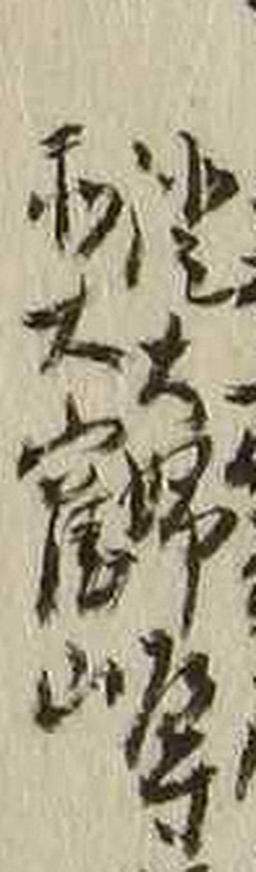所大寵山
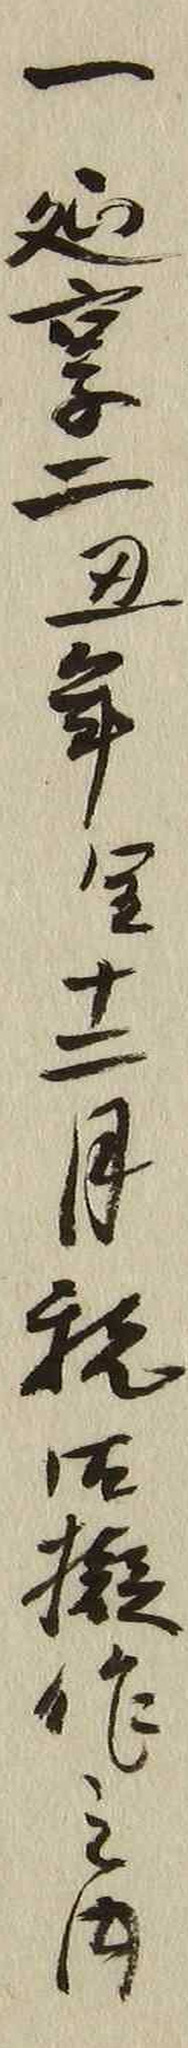一延享二丑年閏十二月親御擬作之内
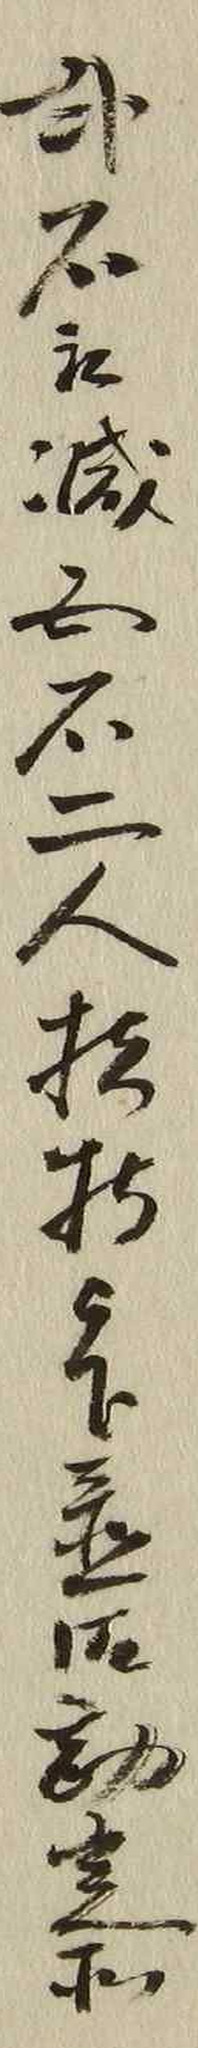弐石被減五石二人扶持被下置御勘定所
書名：諸士系譜　巻之360　す之部10
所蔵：会津若松市立会津図書館
